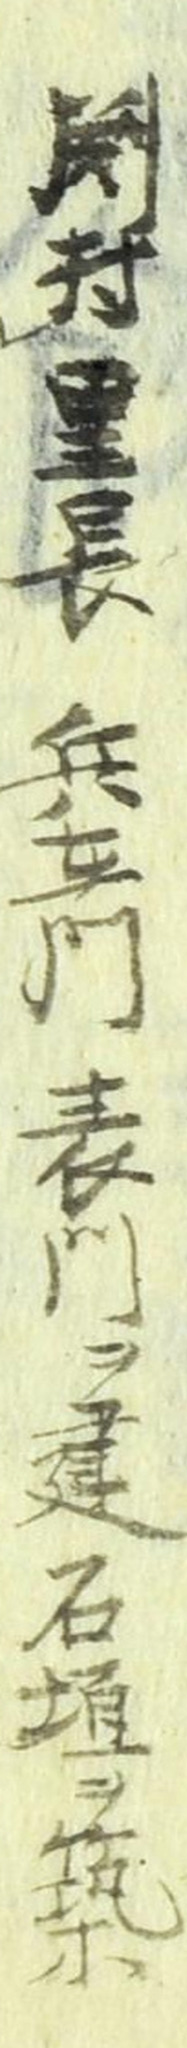淵村里長兵在門表門ヲ建石垣ヲ築

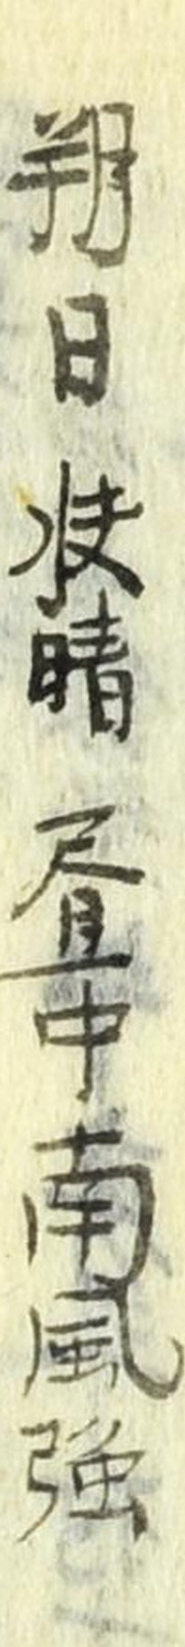朔日快晴昼中南風強
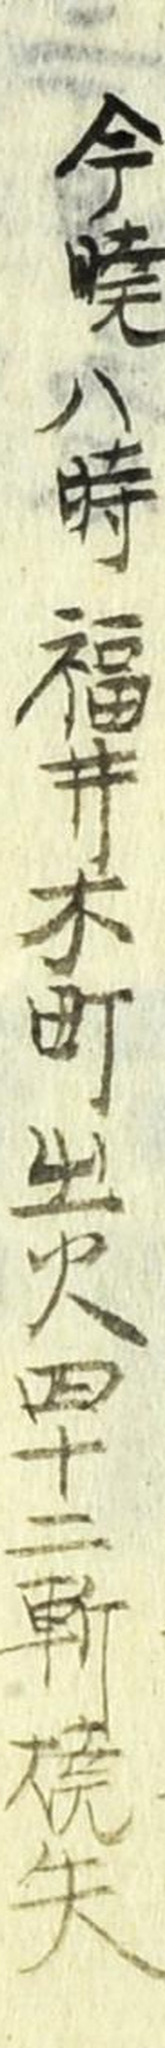今暁八時福井木町出火四十二軒焼失
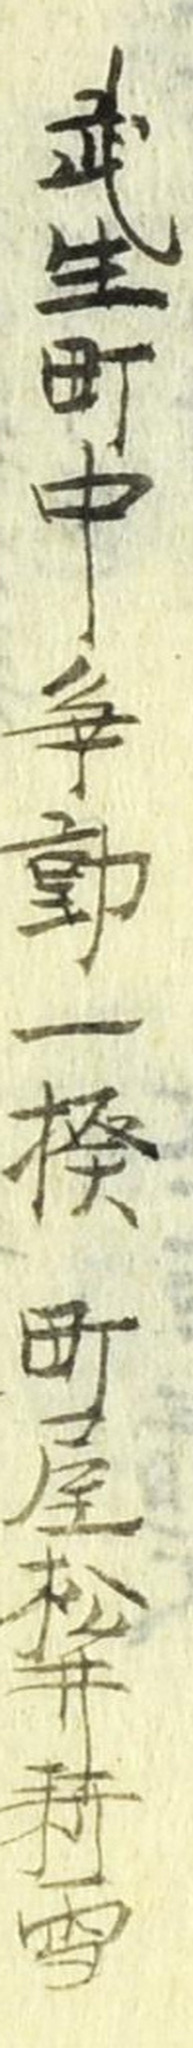武生町中争動一揆町屋松井耕雪
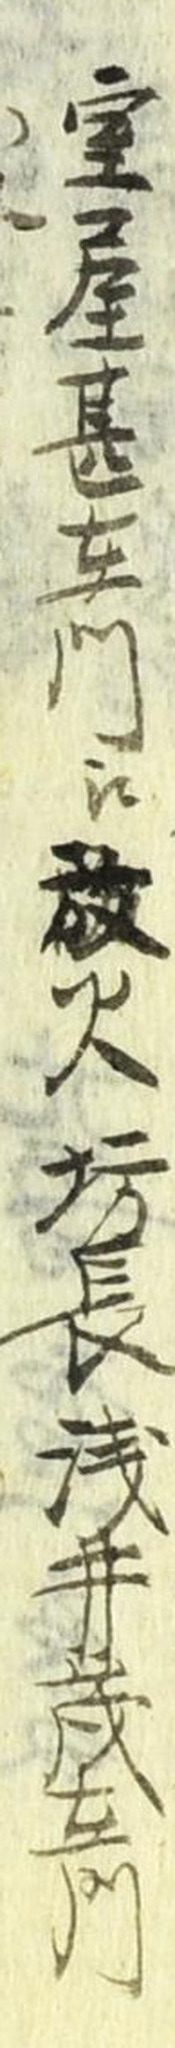室屋甚在門江放火坊長浅井茂在門
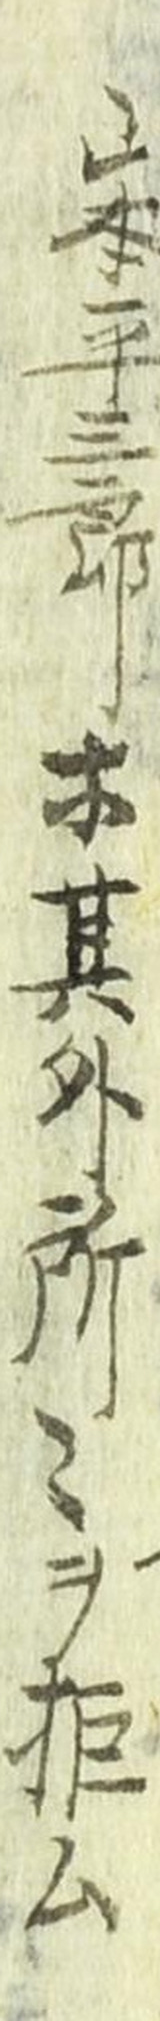山本平三郎等其外所々ヲ拒ム
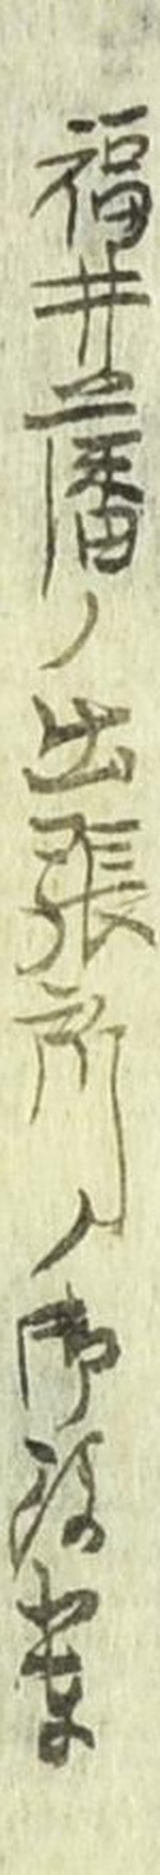福井藩ノ出張所ノ御役輩
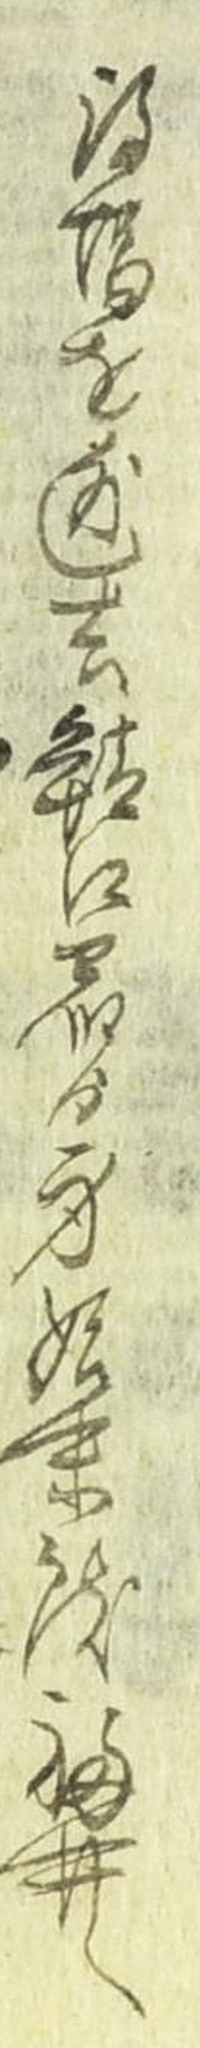役場を逃去鯖江宿ゟ身始末致福井へ
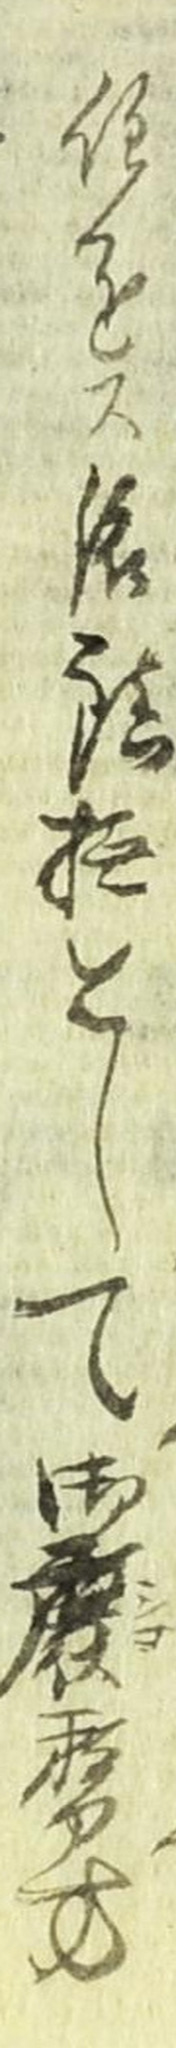註進す依鎮撫として御庶務方
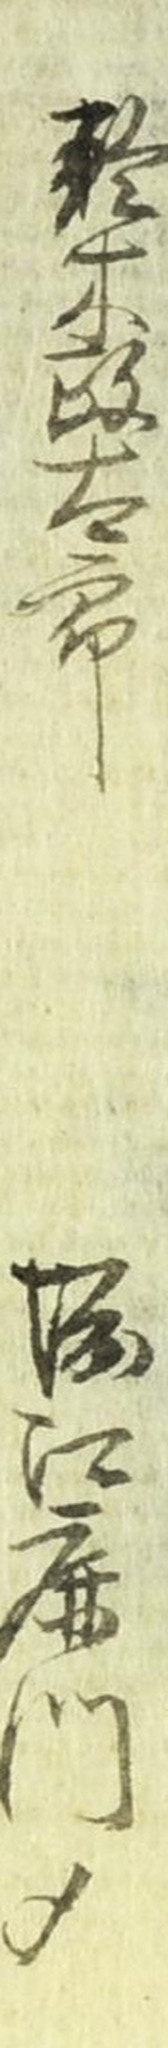鈴木政太郎堀江鹿門〆
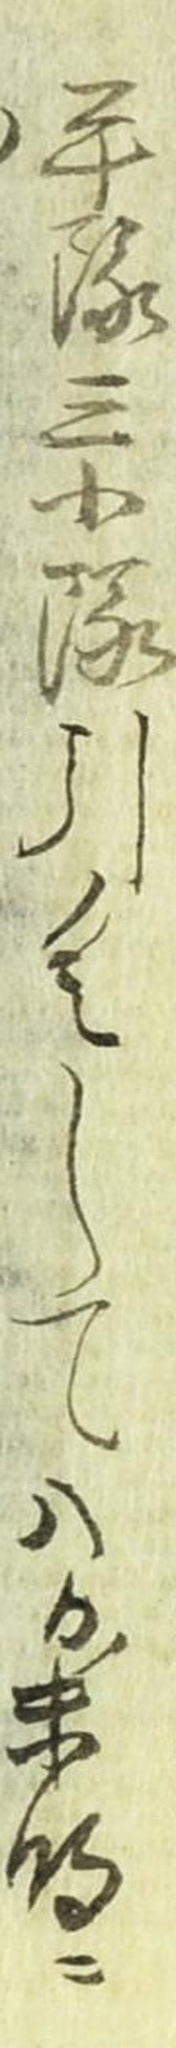平隊三小隊引具して八日ノ未明ニ
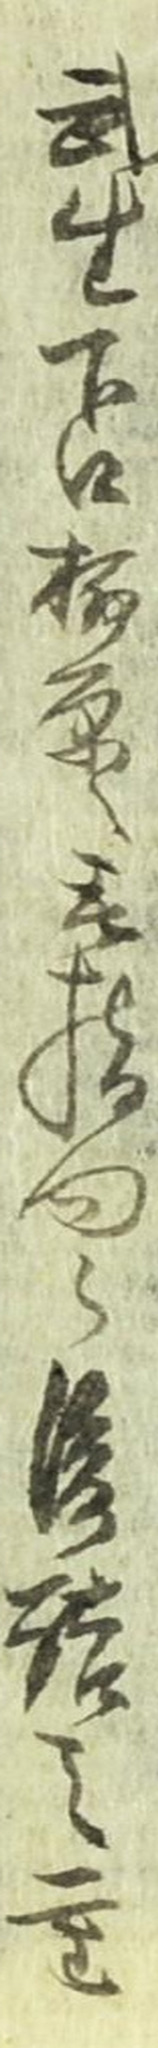武生下口柳原へ被指向候後詰之重
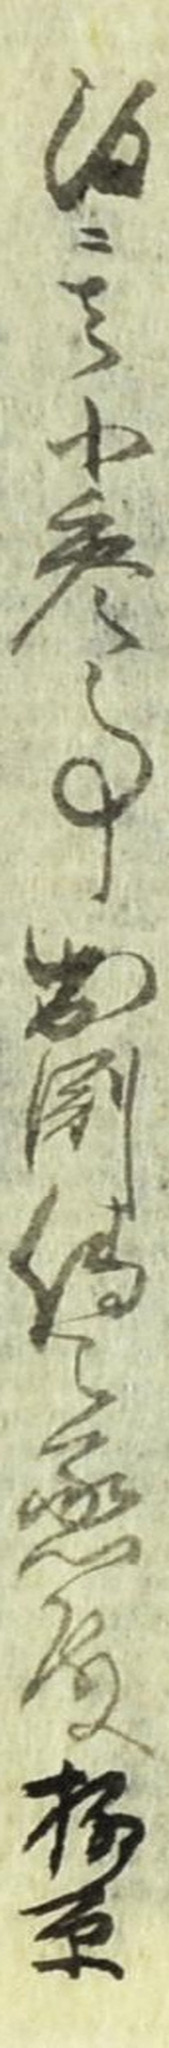役ニ者小参事出淵伝之丞殿柳原
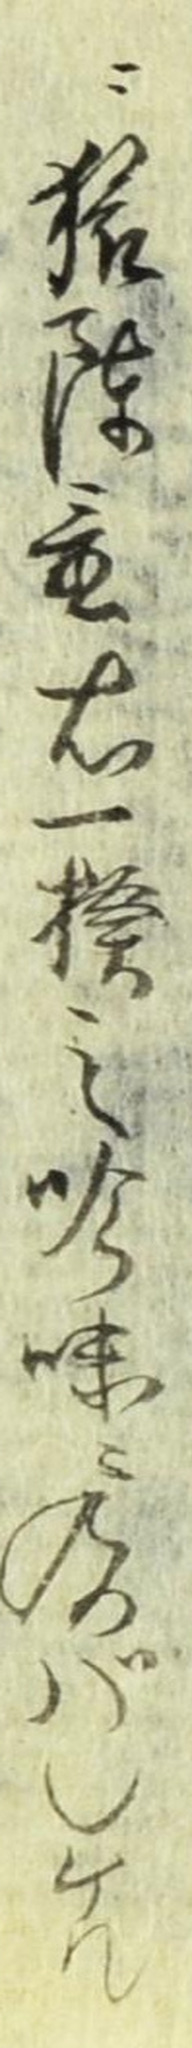ニ脇陣置右一揆之吟味ニ及バレケル

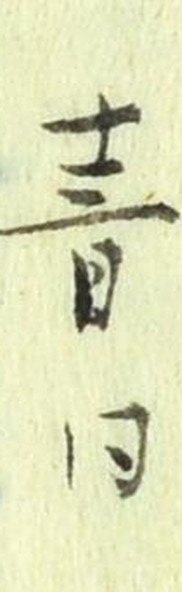十九日同
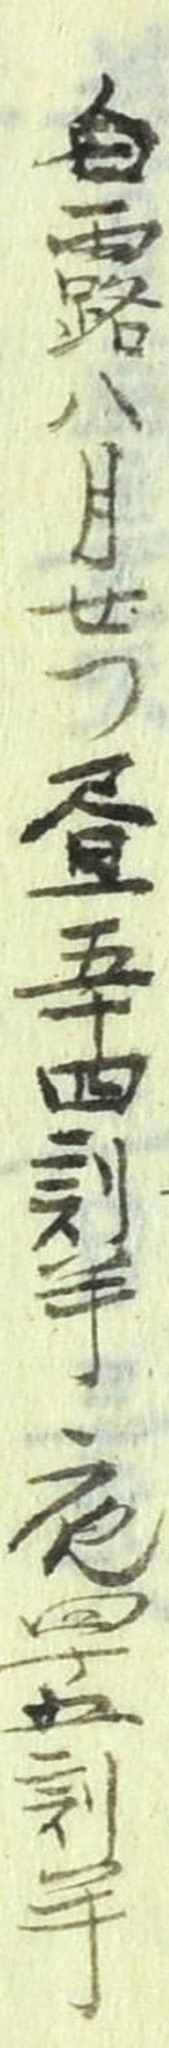白露八月せつ昼五十四刻半夜四十五刻半
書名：（日記）
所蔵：福井県文書館 Fukui Prefectural Archives
